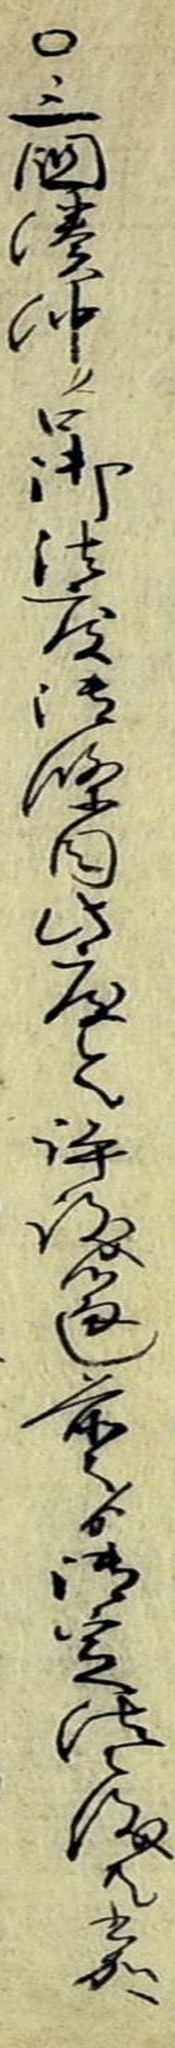〇三国湊沖ノ口御法度御条目此度令評議候通前々ゟ御定法之儀共書加へ
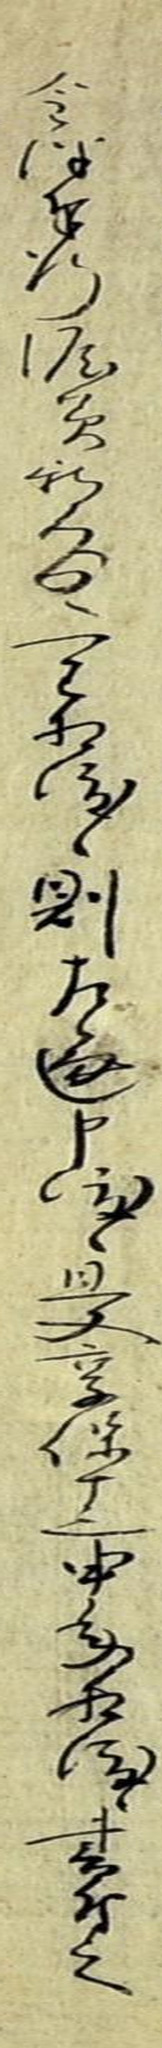金津奉行渥美新右衛門へ可被相渡候則左之通申渡候且又享保十三申年相渡候書付之
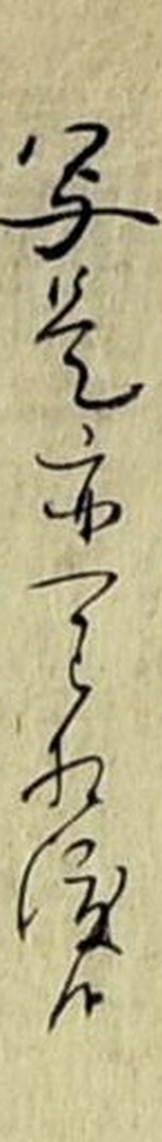写是亦可被相渡候
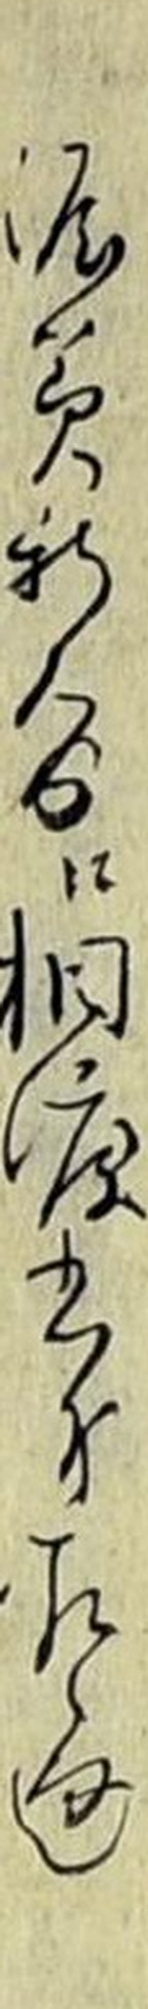渥美新右衛門江相渡書付左之通
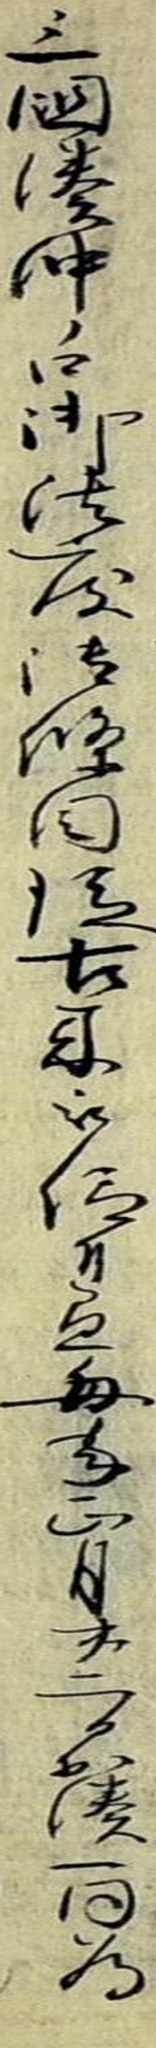三国湊沖ノ口御法度御条目従古来被仰付置毎年正月廿二日於湊一同為
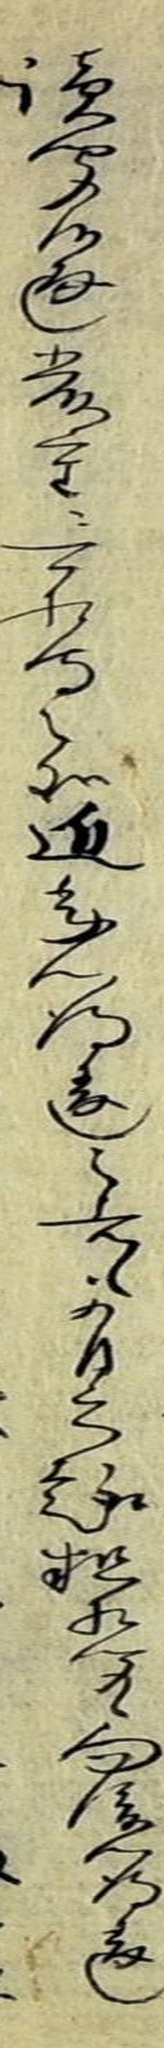読聞候通厳重ニ可相守之処近年心得違之者も有之趣粗相聞候向後心得違
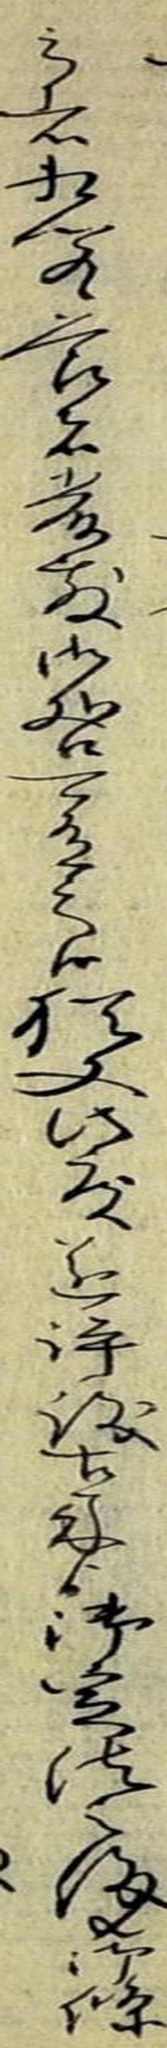之者相聞候節者厳敷御咎可有之候猶又此度遂評議古来ゟ御定法之儀共御条
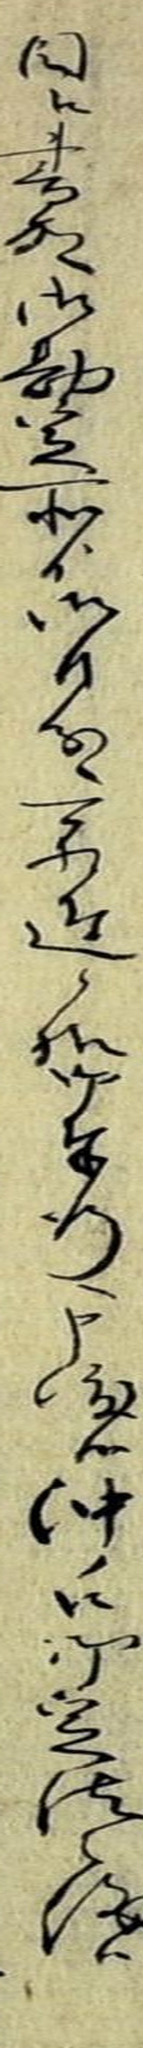目江書加へ御勘定所ゟ御自分へ可相達候様御奉行へ申渡候沖ノ口御定法之儀ハ
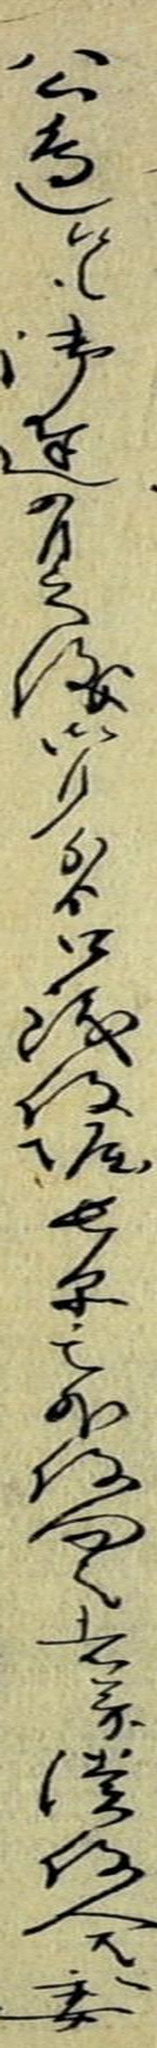公辺江も御達有之儀御自分ゟ口銭役堀長兵衛其外役向之者并湊役人共へ委
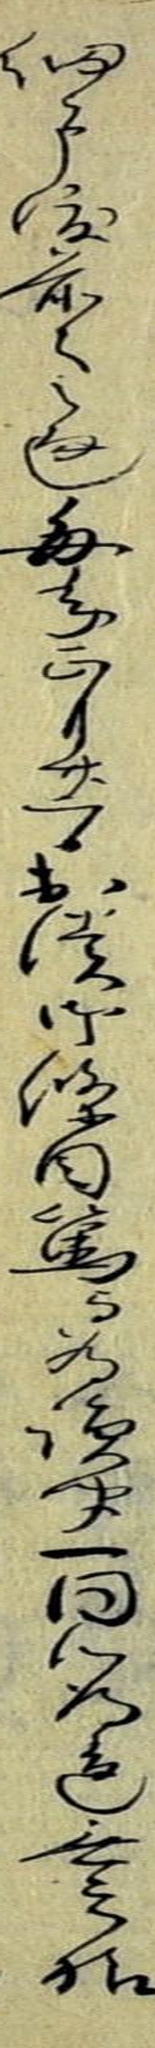細被申渡前々之通毎年正月廿二日於湊御条目篤与為読聞一同心得違無之様
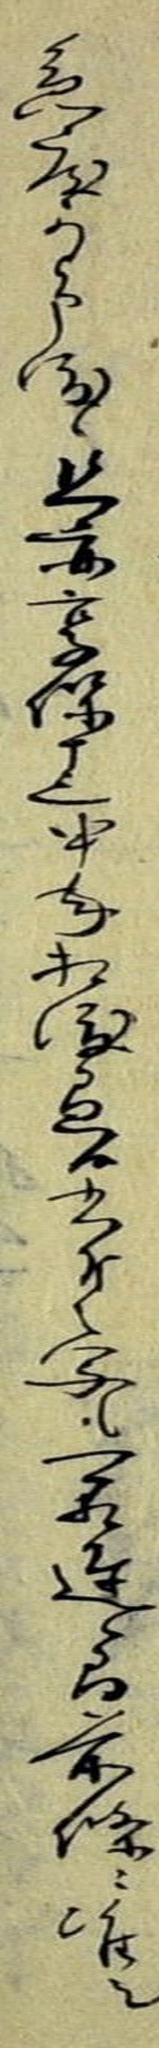急度可被申渡候且亦享保十三申年相渡置候書付之写も可相達候間前条ニ准シ
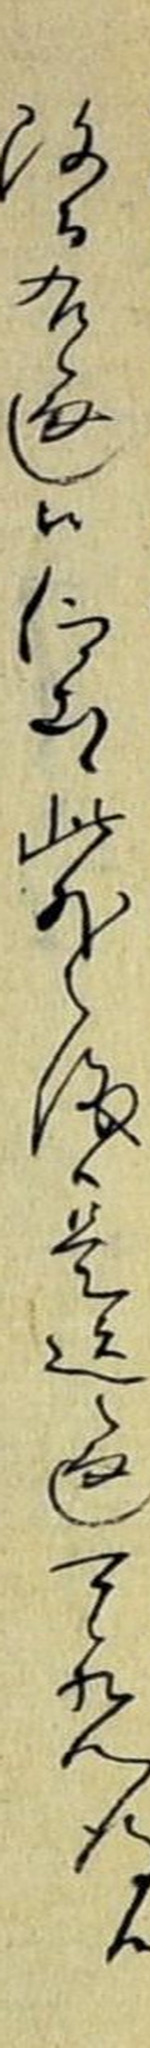改而右之通被仰出候此外之儀ハ是迄之通可被相心得候
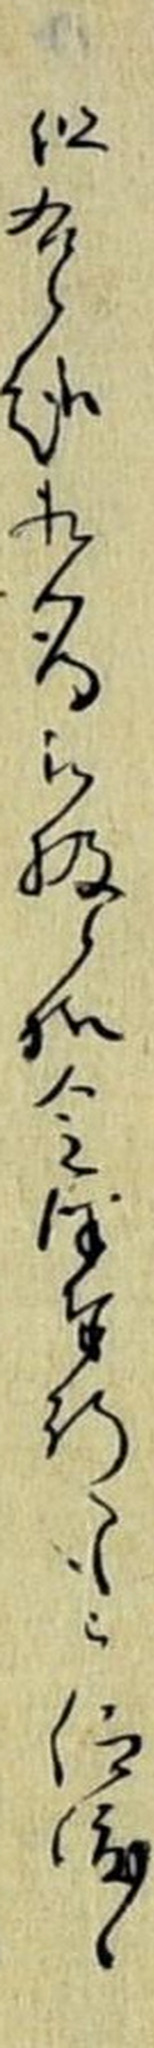但右之趣相心得取扱候様金津奉行へも被仰渡候
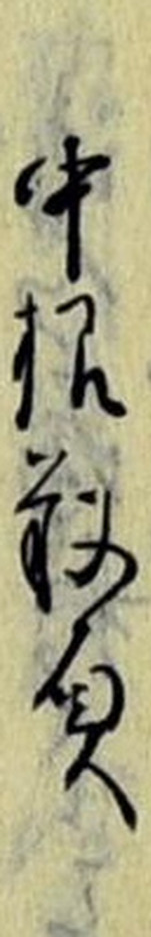中根靱負
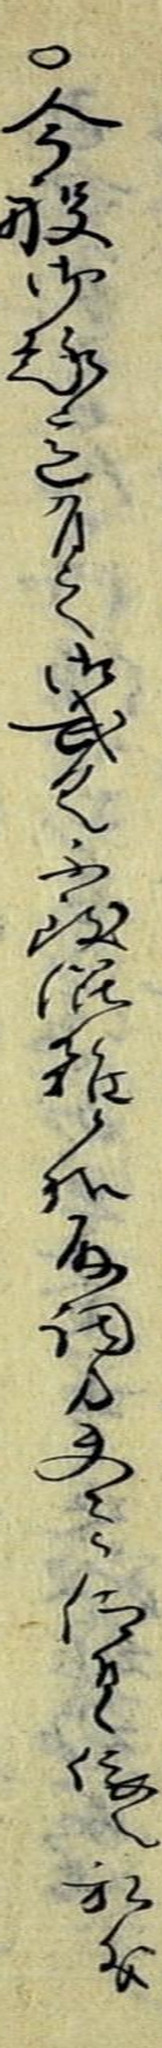〇今般御趣意有之御武具不致混雑候様取調方夫々被仰付候依之私義
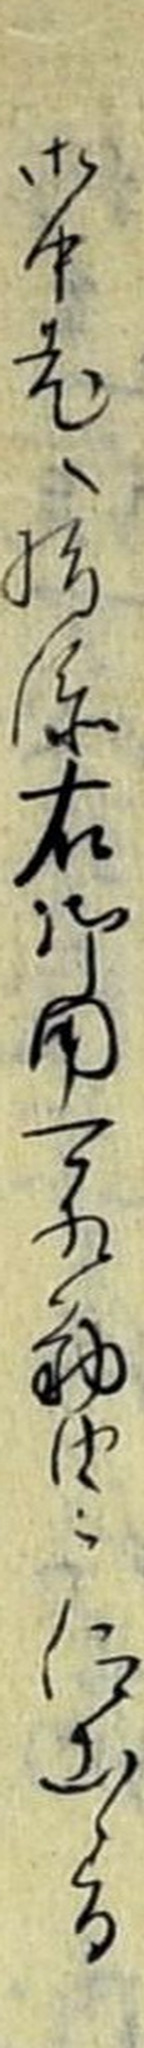御中老へ指添右御用可相勤由被仰出候旨
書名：命令之部 三
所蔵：福井県文書館 Fukui Prefectural Archives
